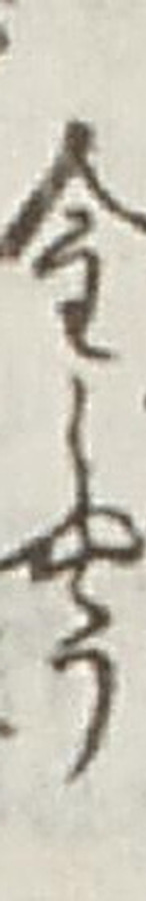金しやう
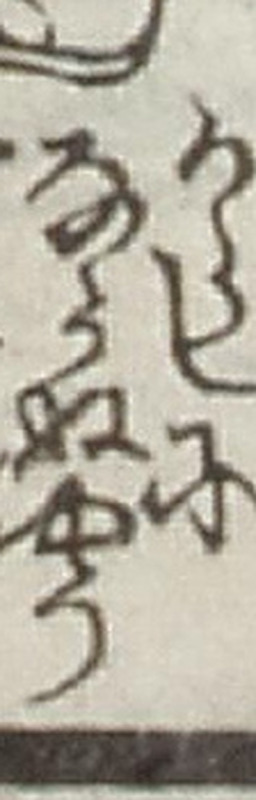ならぬやう
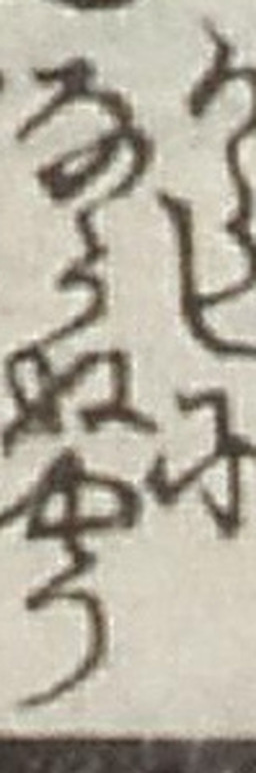ならぬやう
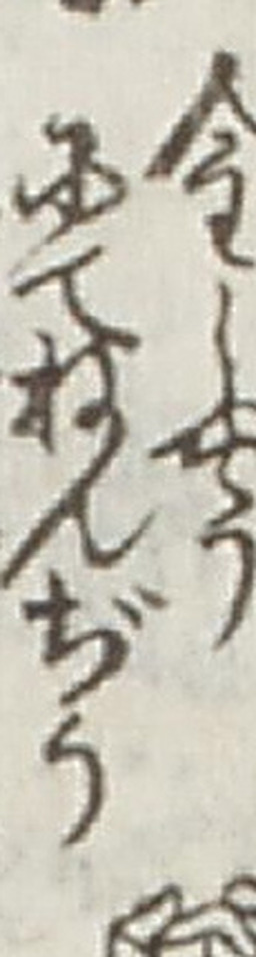にてねんぢう
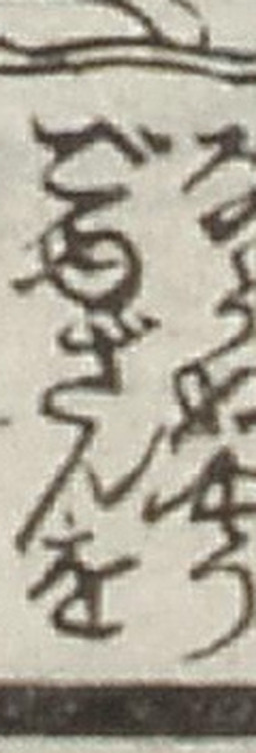ごゆざんを
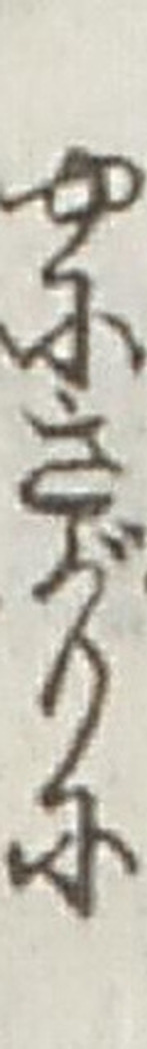やにさがりに
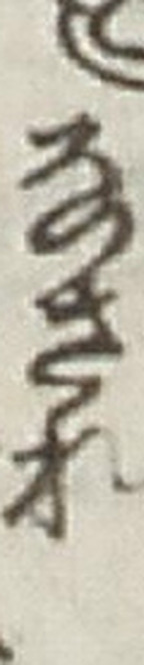なされ
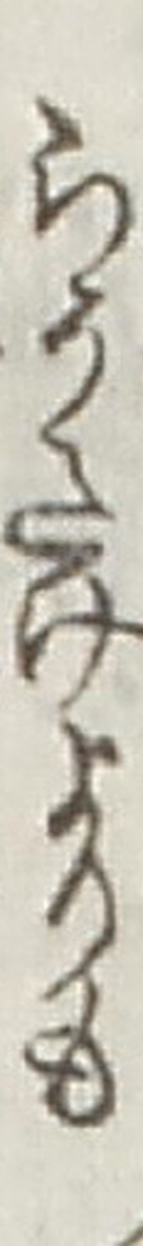らうたけよりも
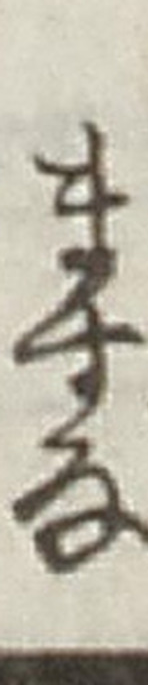ますな
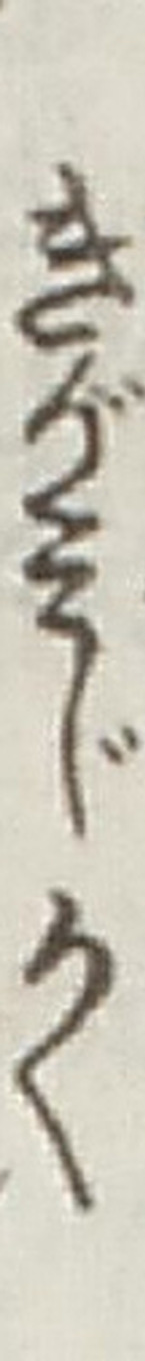きがみじかく
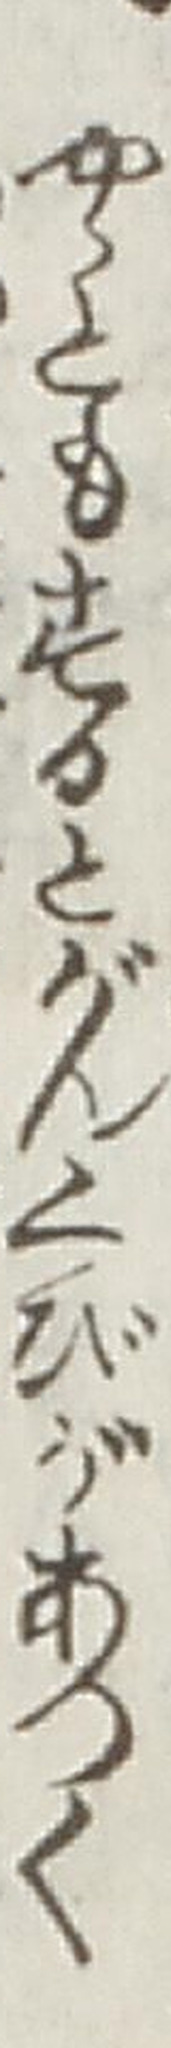やゝともするとがんくびがあつく
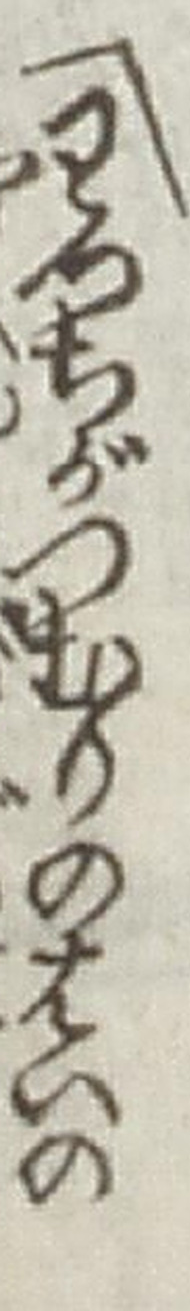〽わつちがつむりのはいの
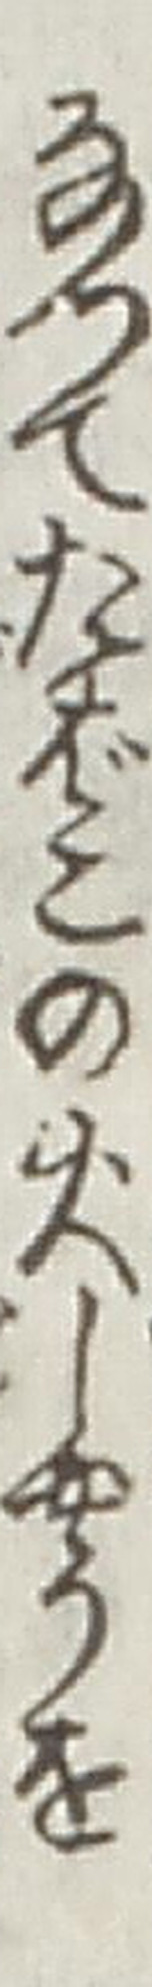なつてたばこの火しやうを
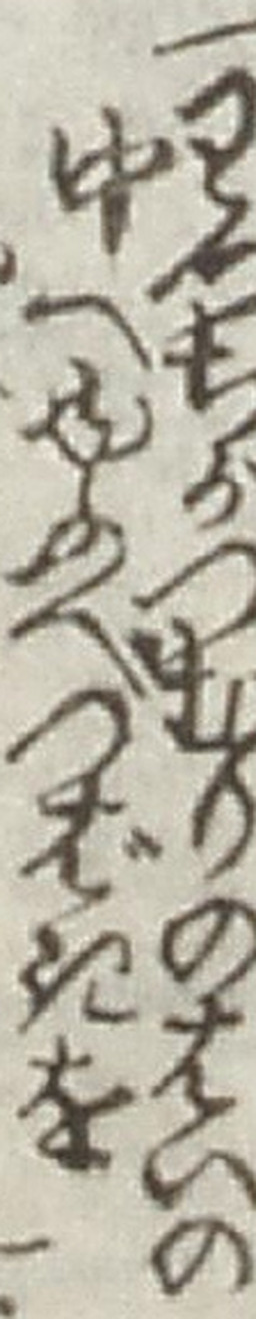中へゆふべつばきを
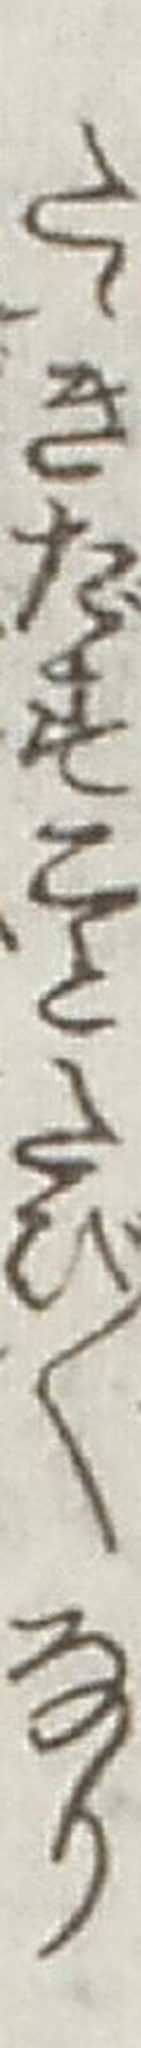たゝきだすことたび〳〵なり
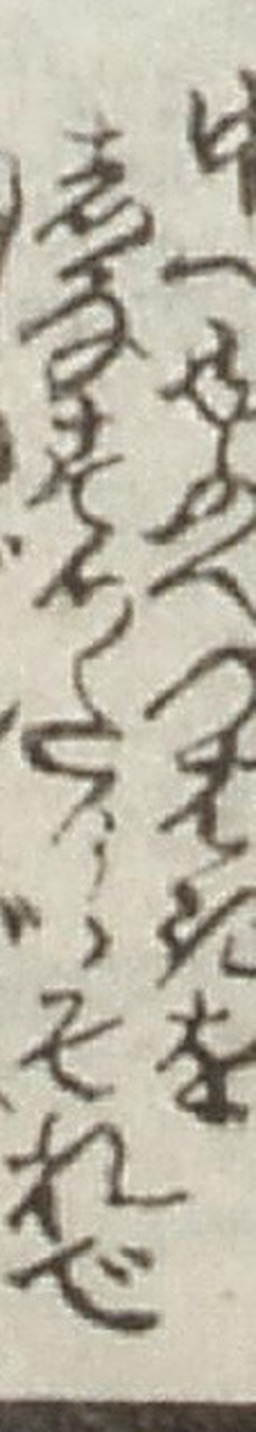しなすつたからそれで
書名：三世相出雲當座帳　上下冊
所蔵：東京大学地震研究所図書室 Earthquake Research Institute Library, The University of Tokyo, JAPAN
